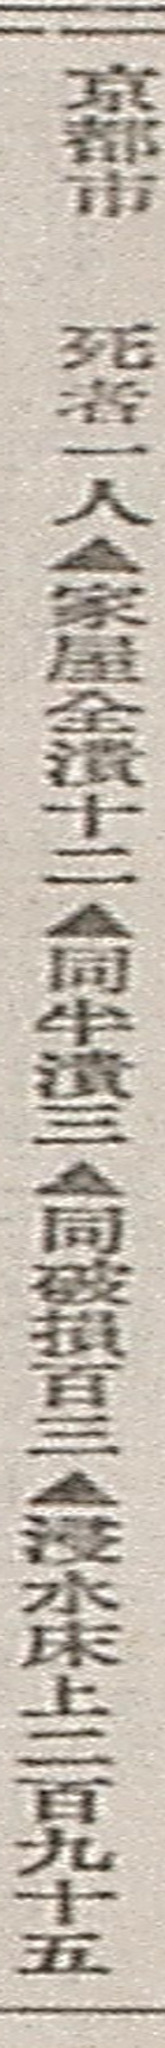京都市死者一人▲家屋全潰十二▲同半潰三▲同破損百三▲浸水床上二百九十五
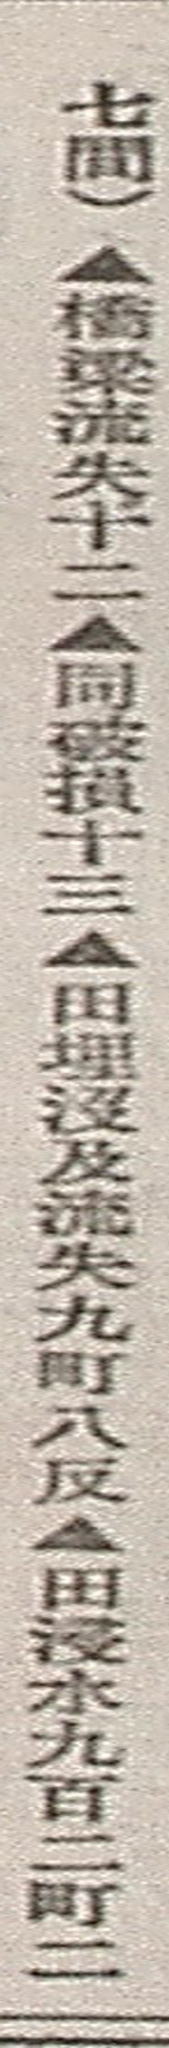七間）▲橋梁流失十二▲同破損十三▲田埋没及流失九町八反▲田浸水九百二町二
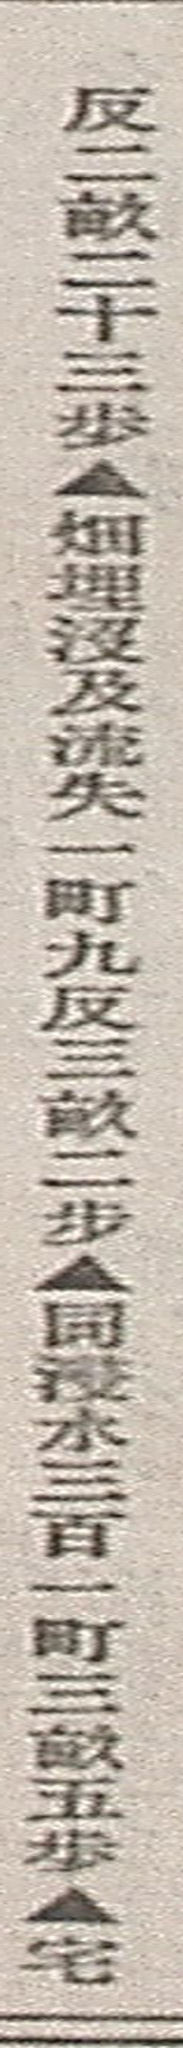反二畝二十三歩▲畑埋没及流失一町九反三畝二歩▲同浸水三百一町三畝五歩▲宅
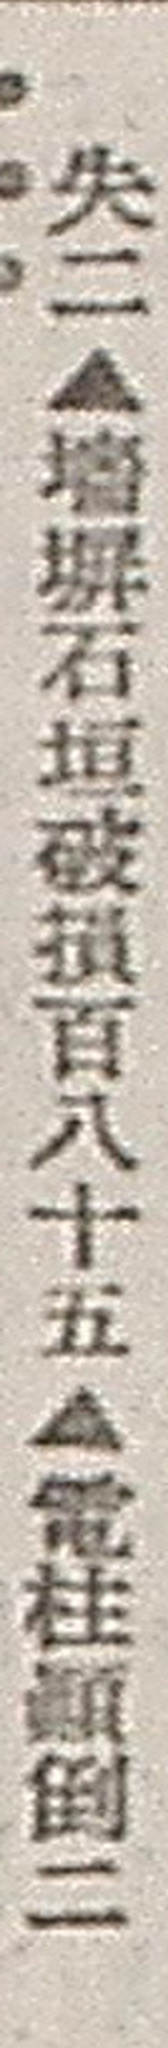失二▲墻塀石垣破損百八十五▲電柱顚倒二
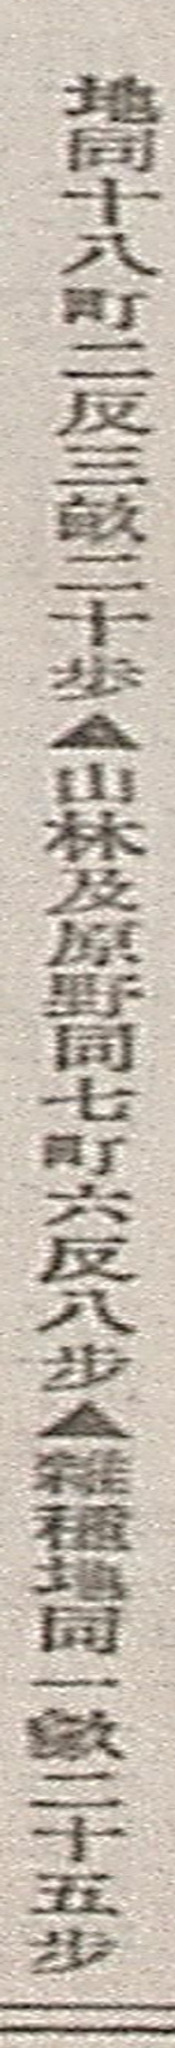地同十八町二反三畝二十歩▲山林及原野同七町六反八歩▲雑種地同一畝二十五歩
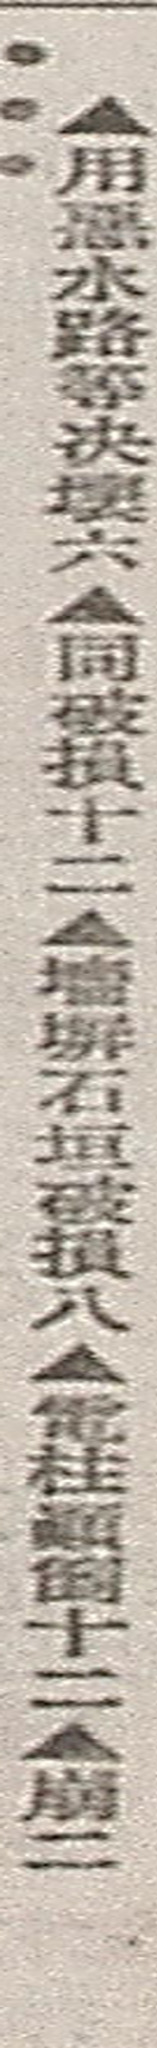▲用悪水路等决壊六▲同破損十二▲墻塀石垣破損八▲電柱顚倒十二▲崩二
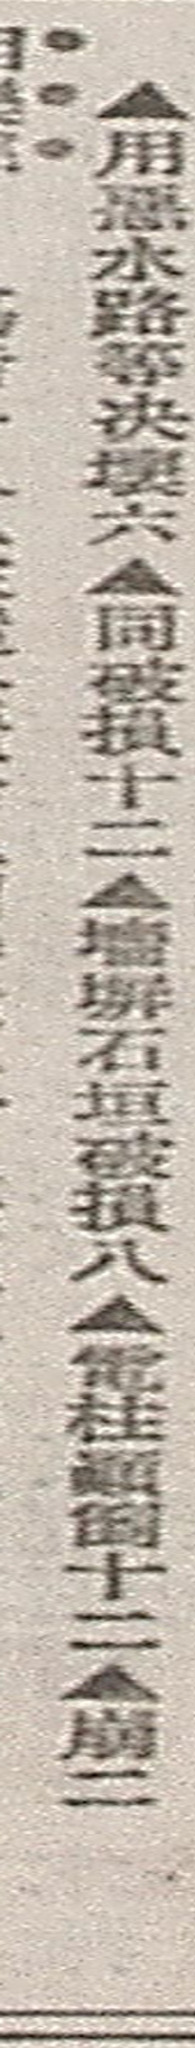▲用悪水路等决壊六▲同破損十二▲墻塀石垣破損八▲電柱顚倒十二▲崩二
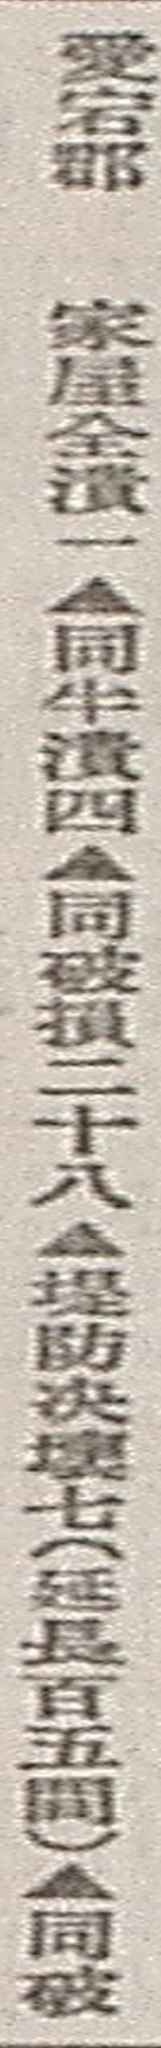愛宕郡家屋全潰一▲同半潰四▲同破損二十八▲堤防决潰七▲同破
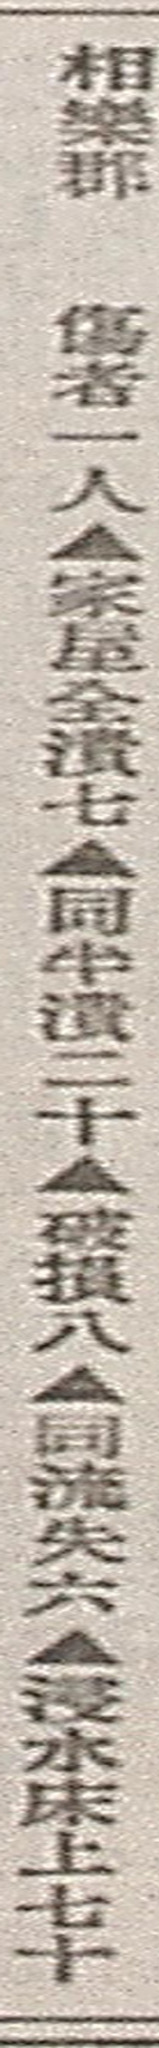相楽郡傷者一人▲家屋全潰七▲同半潰二十▲破損八▲同流失六▲浸水床上七十
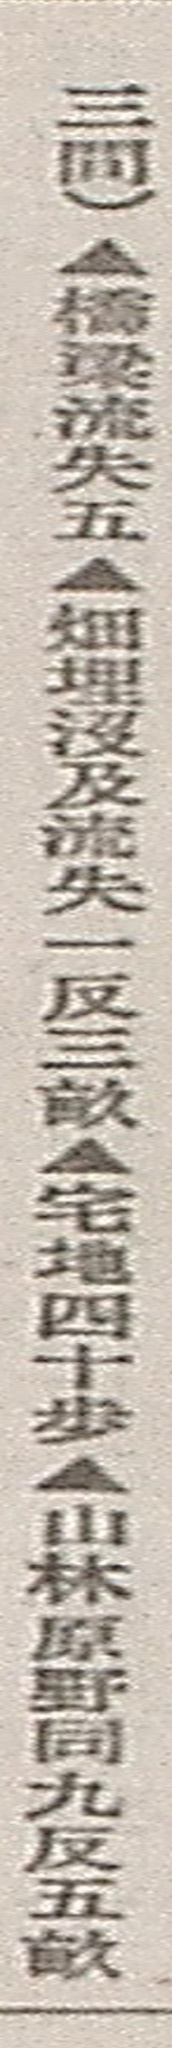三間）▲橋梁流失五▲畑埋没及流失一反三畝▲宅地四十歩▲山林原野々九反五畝
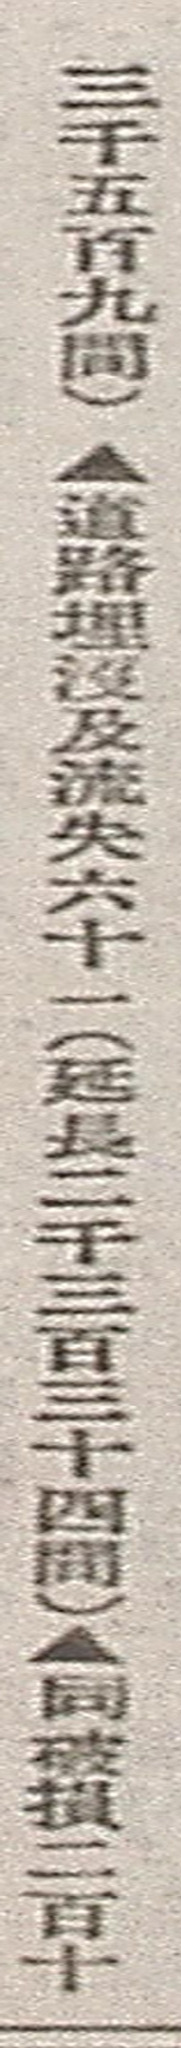三千五百九間）▲道路埋没及流失六十一▲同破損二百十
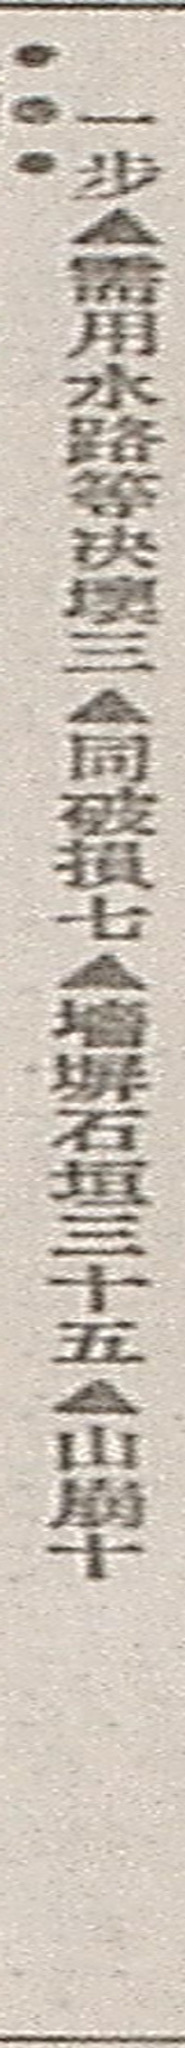一部▲需用水路等決壊三▲同破損七▲墻塀石垣三十五▲山崩十
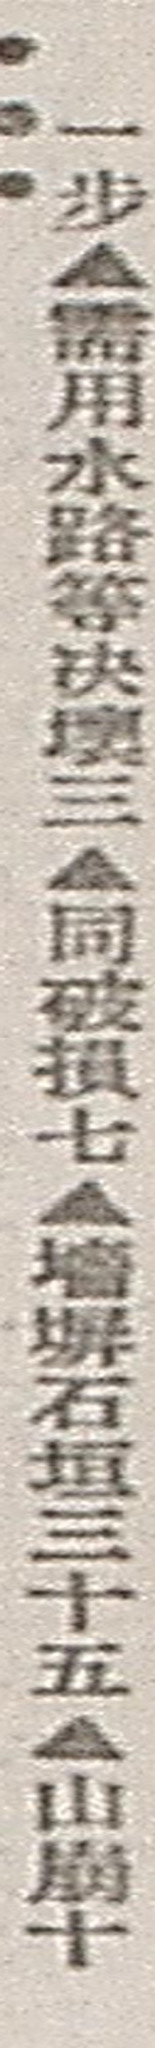一部▲需用水路等決壊三▲同破損七▲墻塀石垣三十五▲山崩十
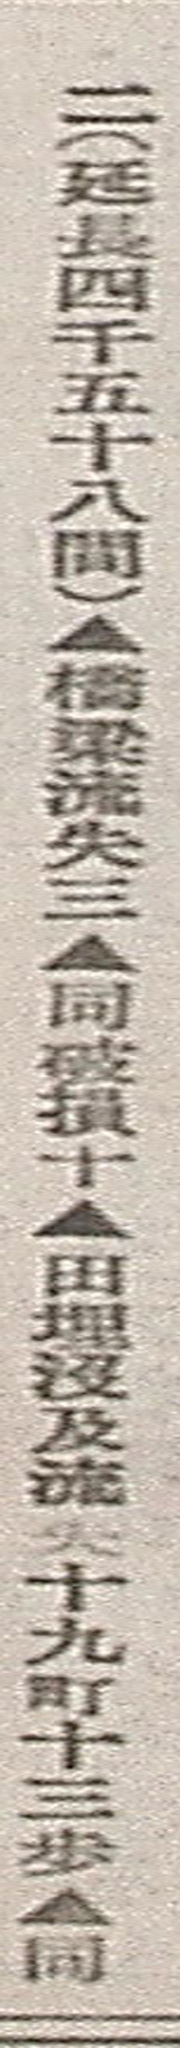二橋梁流失三▲同破損十▲田埋没及流失十九町十三歩▲同
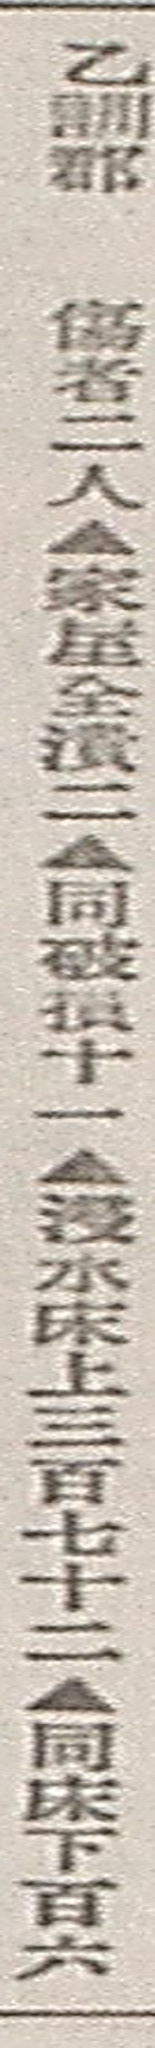乙訓郡傷者二人▲家屋全潰二▲同破損十一▲浸水床上三百七十二▲同床下百六
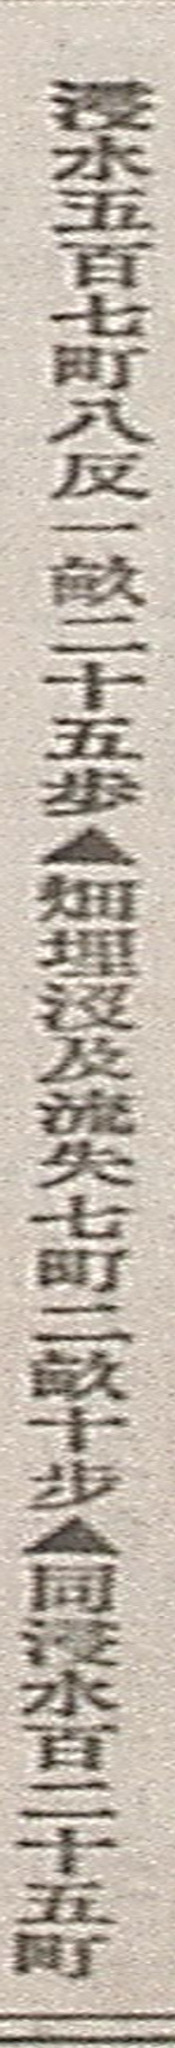浸水五百七町八反一畝二十五歩▲畑埋没及流失七町二畝十歩▲同浸水百二十五町
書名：風俗畫報臨時増刊第百二十八號　洪水被害録（下）
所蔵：東京大学地震研究所図書室 Earthquake Research Institute Library, The University of Tokyo, JAPAN
